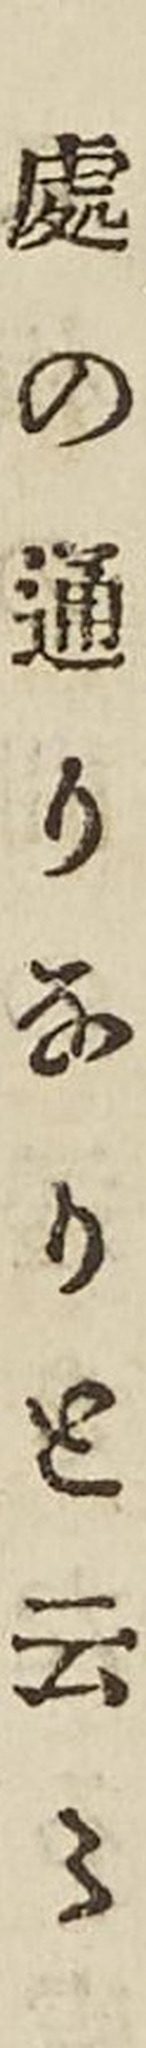処の通りなりと云々
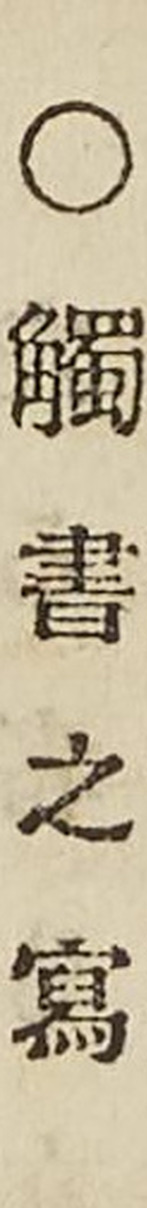○触書之写
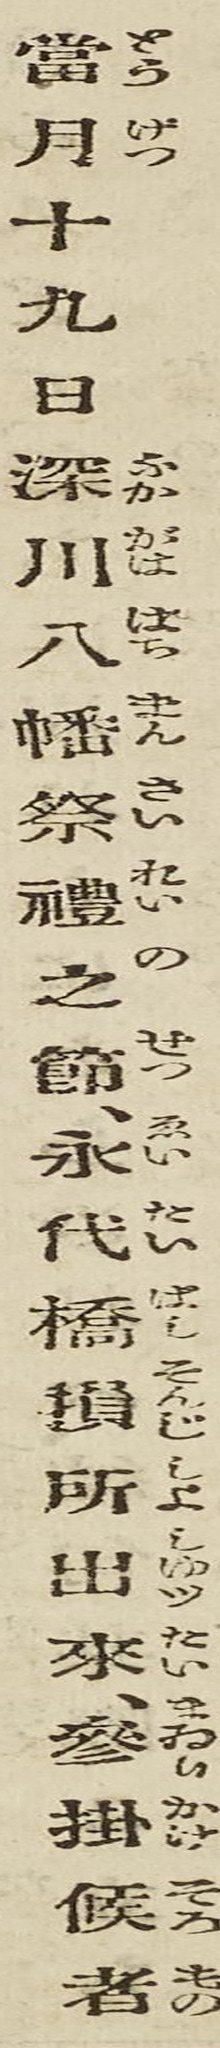当月十九日深川八幡祭礼之節、永代橋損所出来、参掛候者
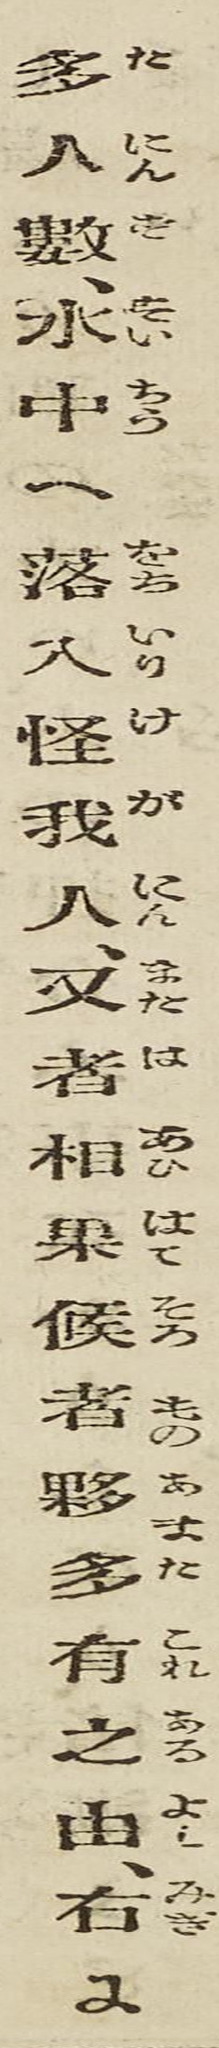多人数、水中へ落入怪我人、又者相果候者夥多有之由、右に
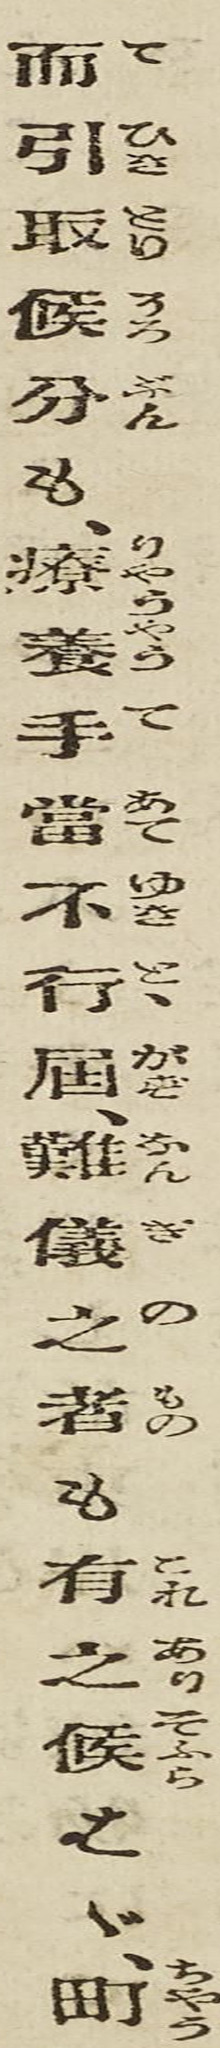而引取候分も、療養手当不行届、難儀之者も有之候はゞ、町
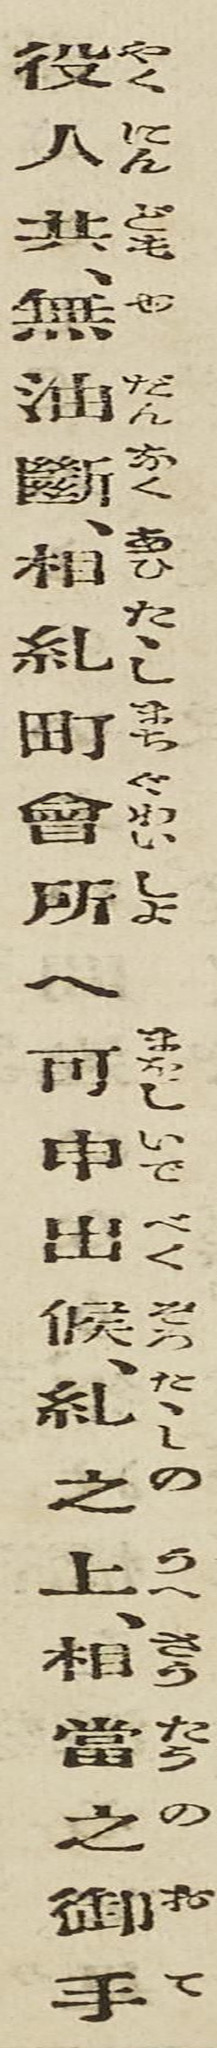役人共、無油断、相糺町会所へ可申出候、糺之上、相当之御手
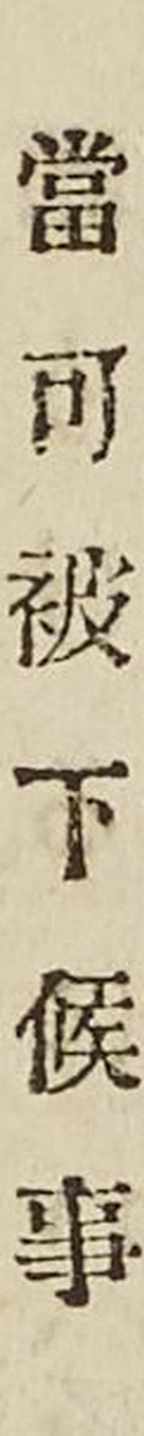当可被下候事
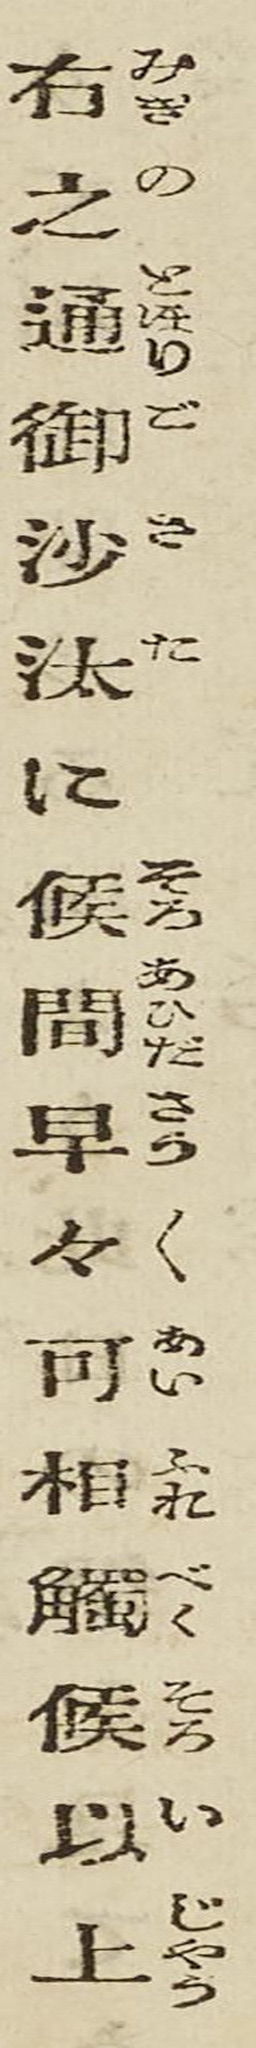右之通御沙汰に候間早々可相触候以上
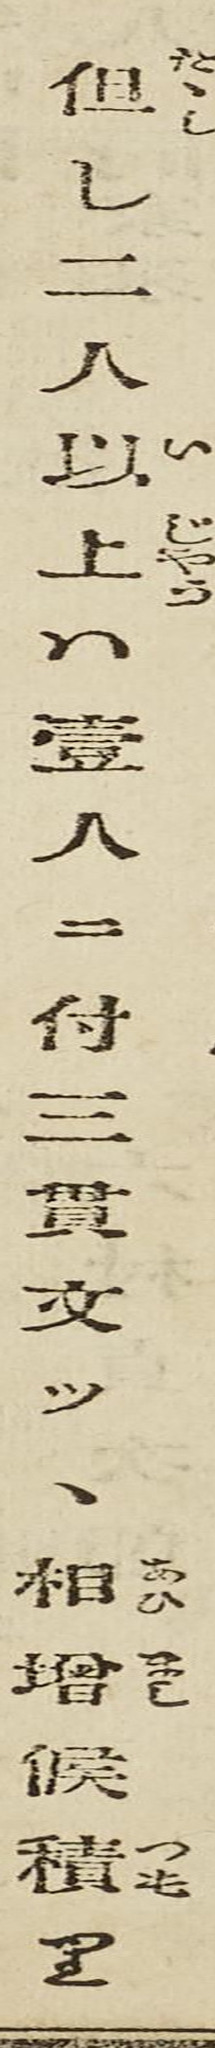但し二人以上は一人に付三貫文つゝ相増候積り
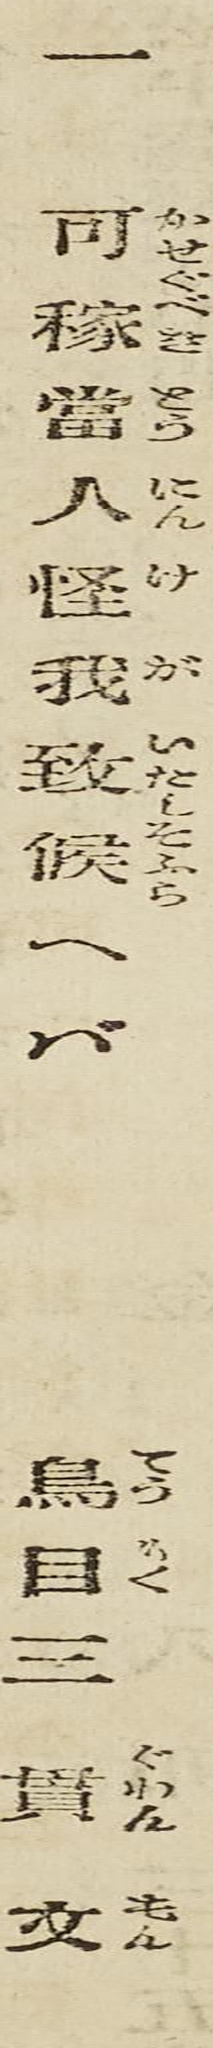一可稼当人怪我致候へば可鳥目三貫文
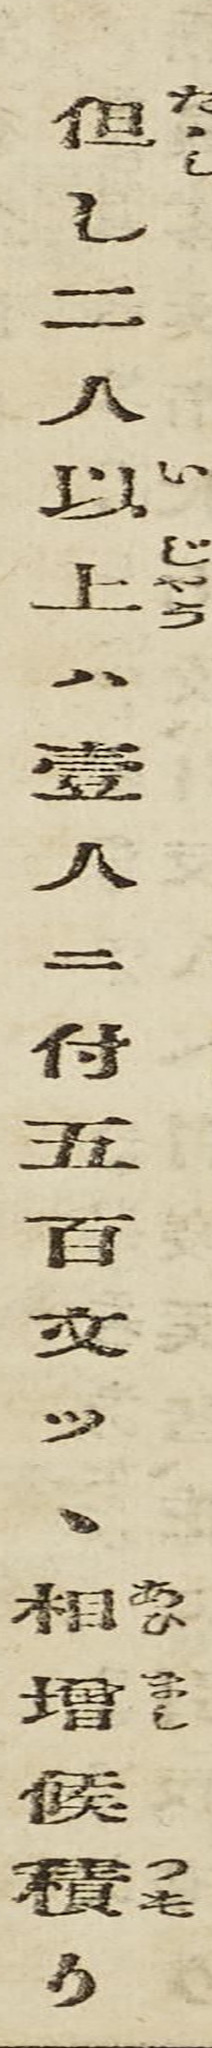但し二人以上は一人に付五百文つゝ相増候積り
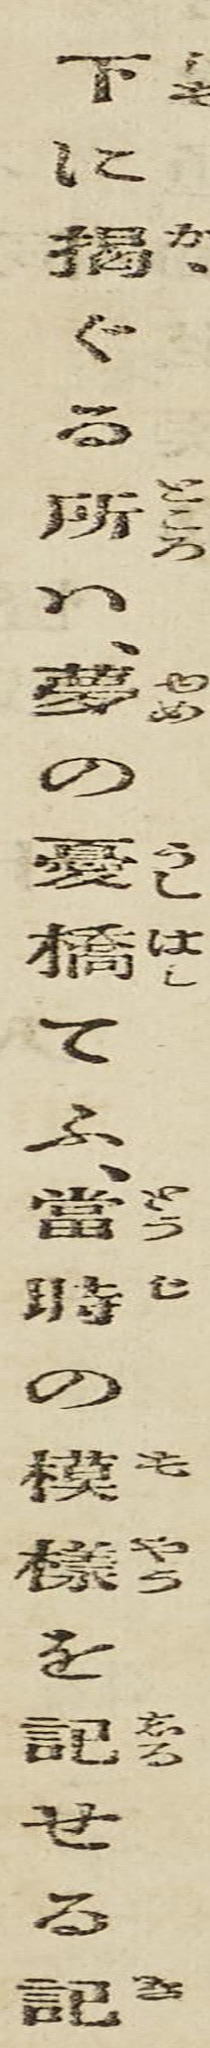下に掲ぐる所は、夢の憂橋てふ、当時の模様を記せる記
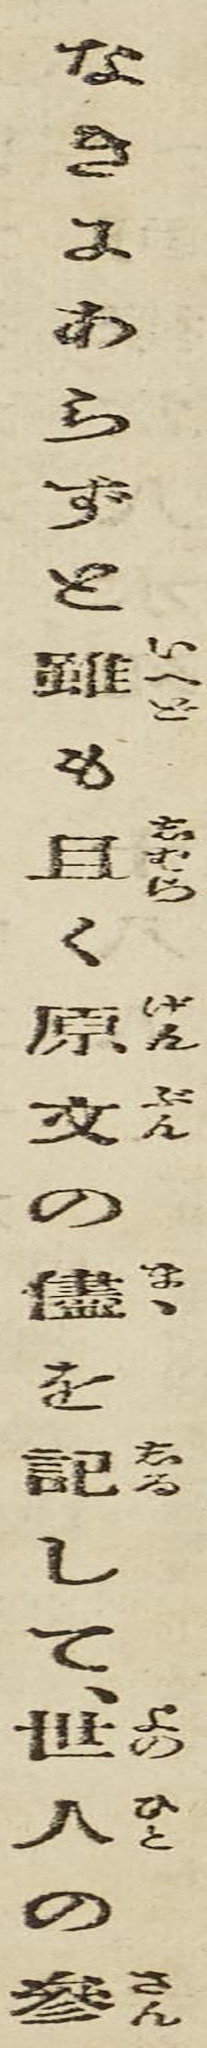なきにあらずと雖も且く原文の儘を記して、世人の参
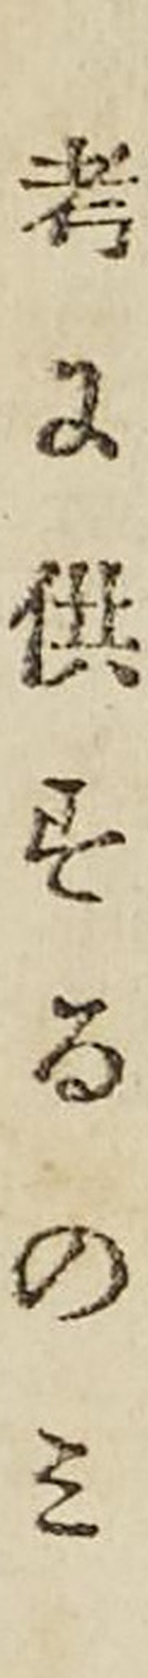考に供するのみ
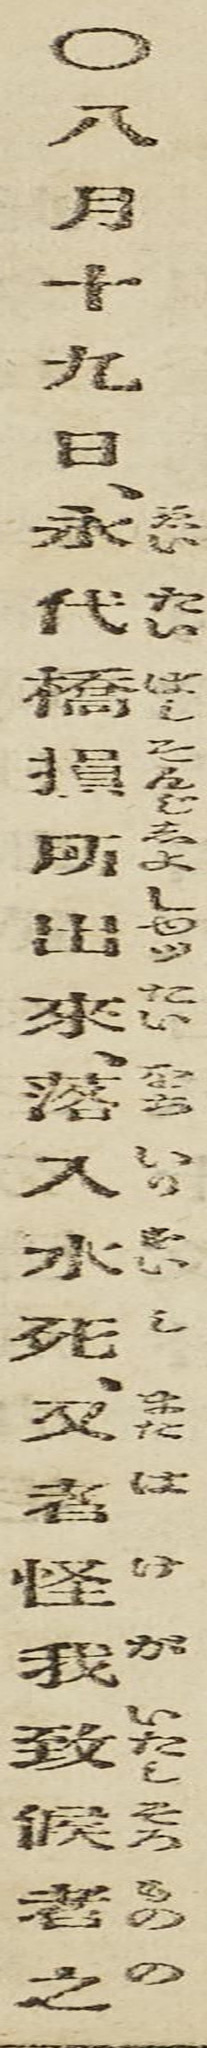○八月十九日、永代橋損所出来、落入水死、又者怪我致候者之
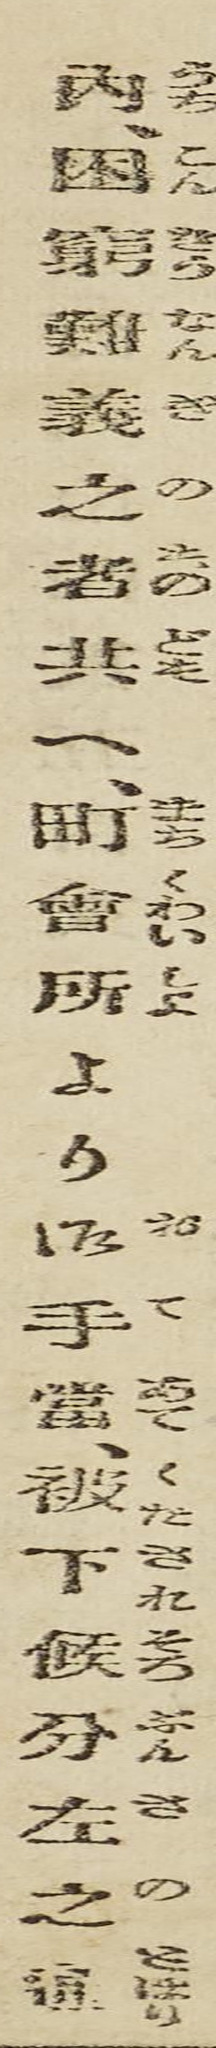内、困窮難義之者共へ、町会所より御手当、被下候分左之通
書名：永代惨話　文化の夢　全
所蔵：東京大学地震研究所図書室 Earthquake Research Institute Library, The University of Tokyo, JAPAN
